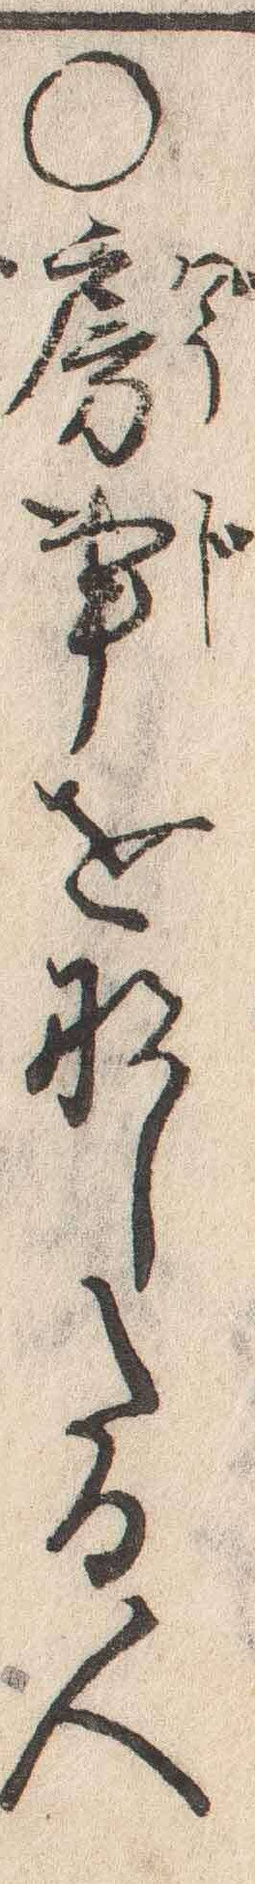○房事をなしたる人
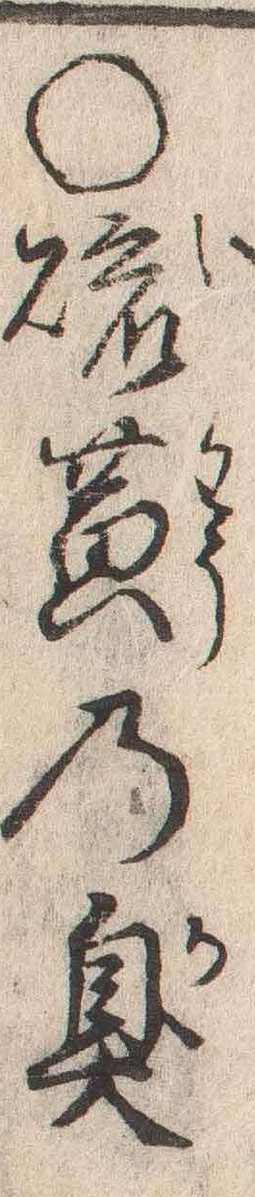○硫黄の臭

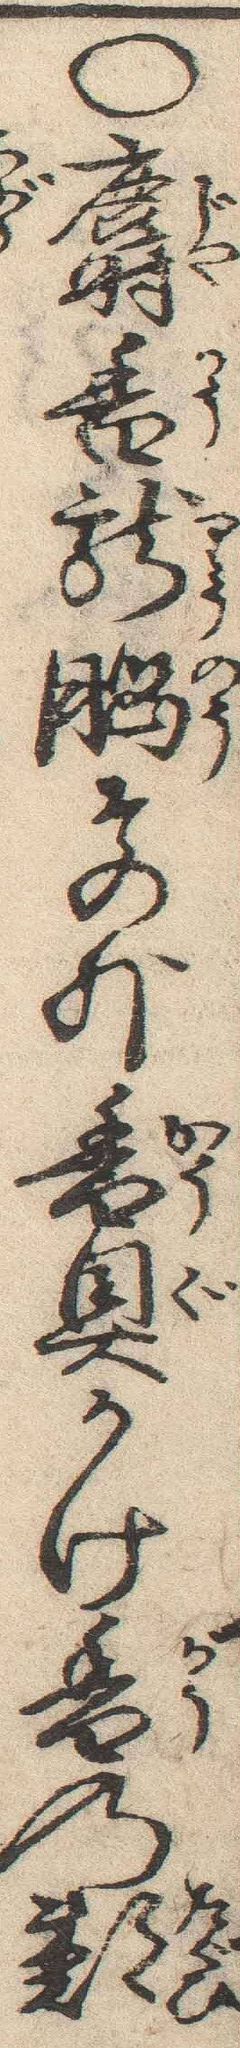○麝香竜脳その外香具かけ香の類
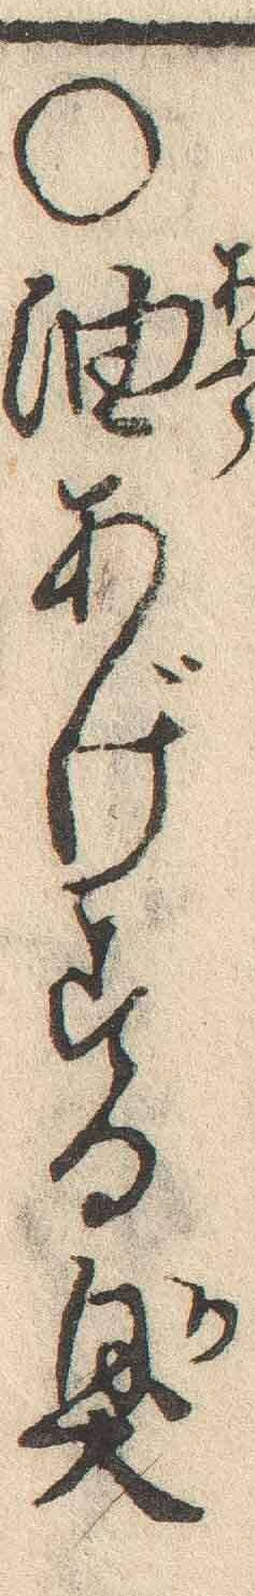○油あげする臭
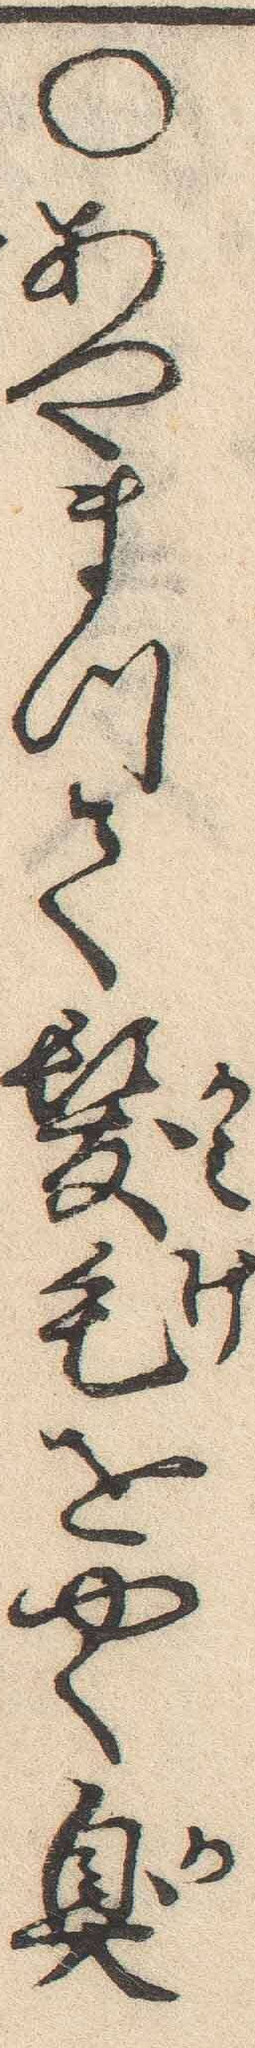○あやまつて髪毛をやく臭
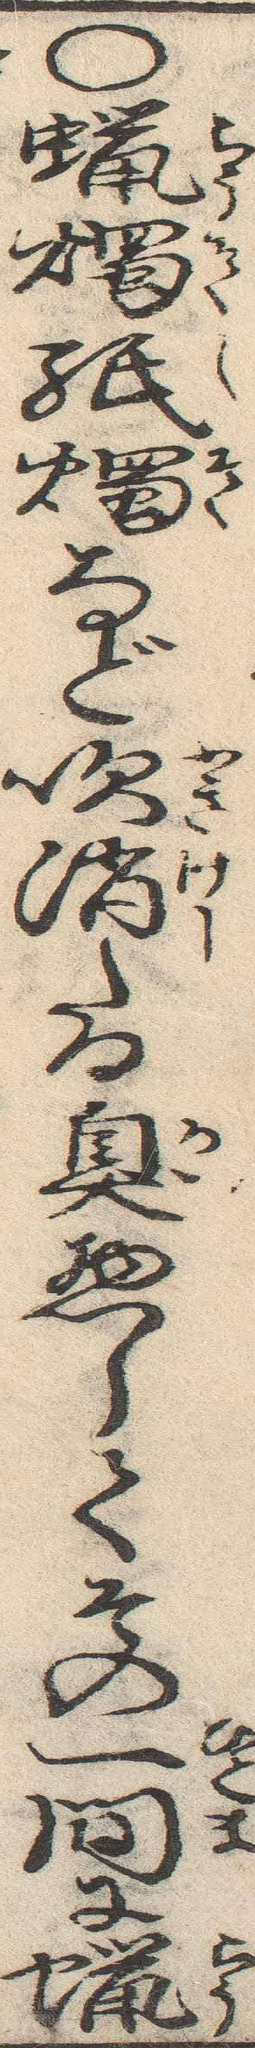○蝋燭紙燭など吹消たる臭総してその一間に蝋
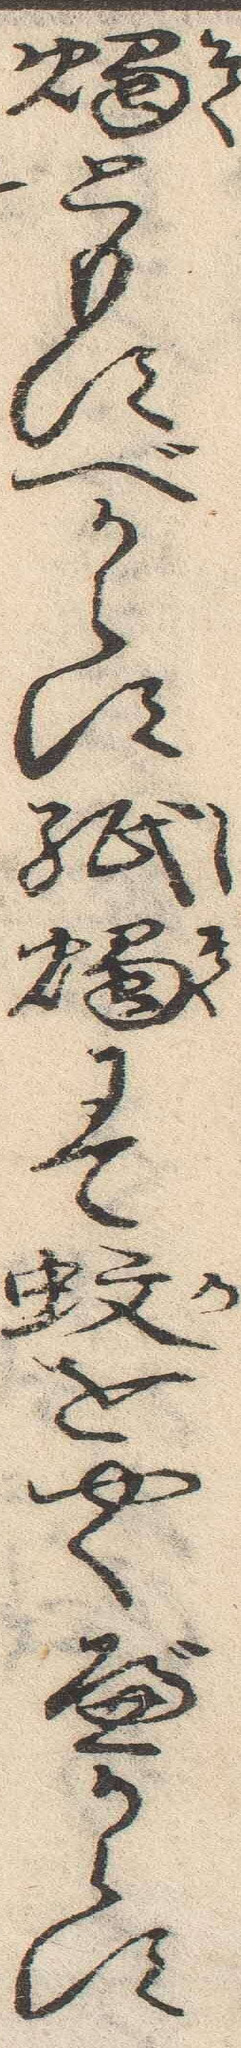燭ともすべからす紙燭にて蚊をやくべからす
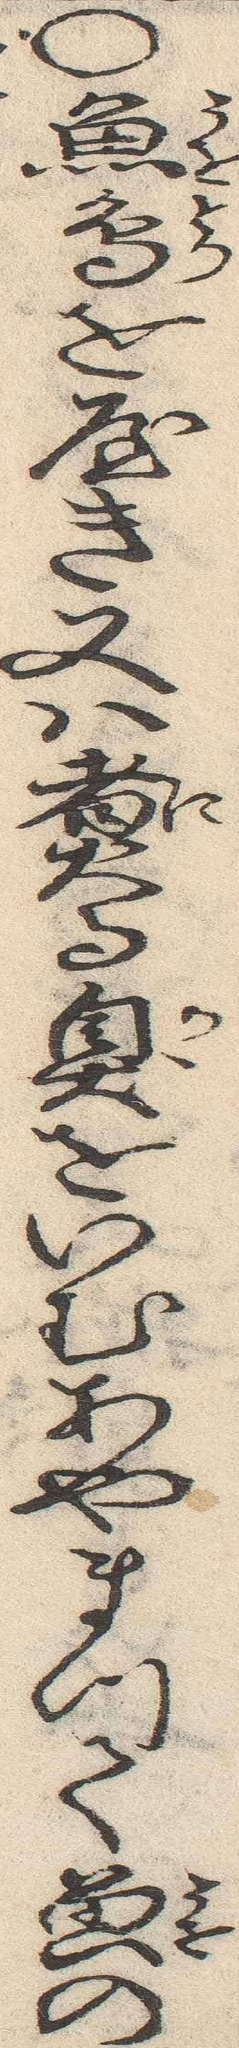○魚鳥をやき又は煮る臭をいむあやまつて魚の
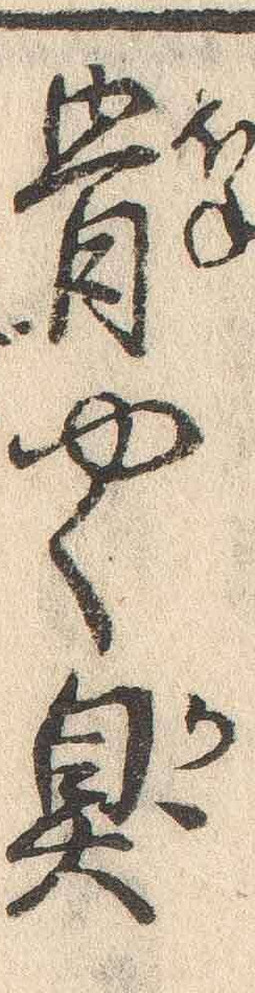骨やく臭
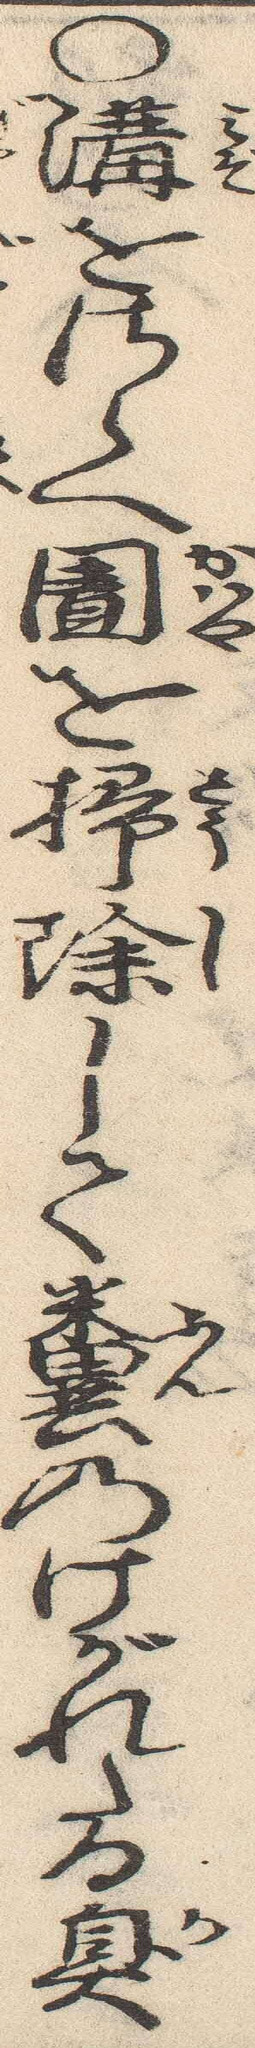○溝をさらへ圊を掃除して糞のけがれたる臭
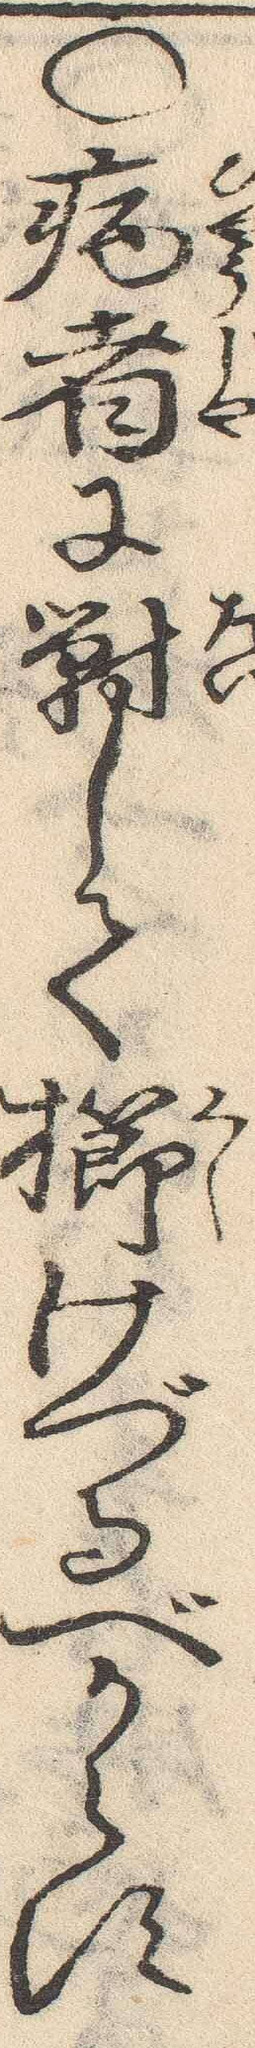○病者に対して櫛けづるべからす
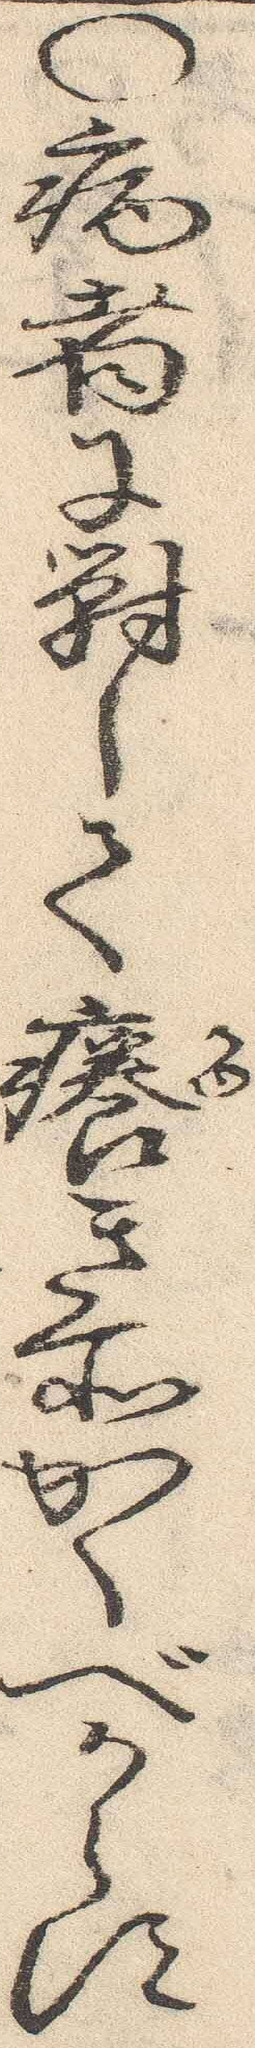○病者に対して癢き所かくべからす
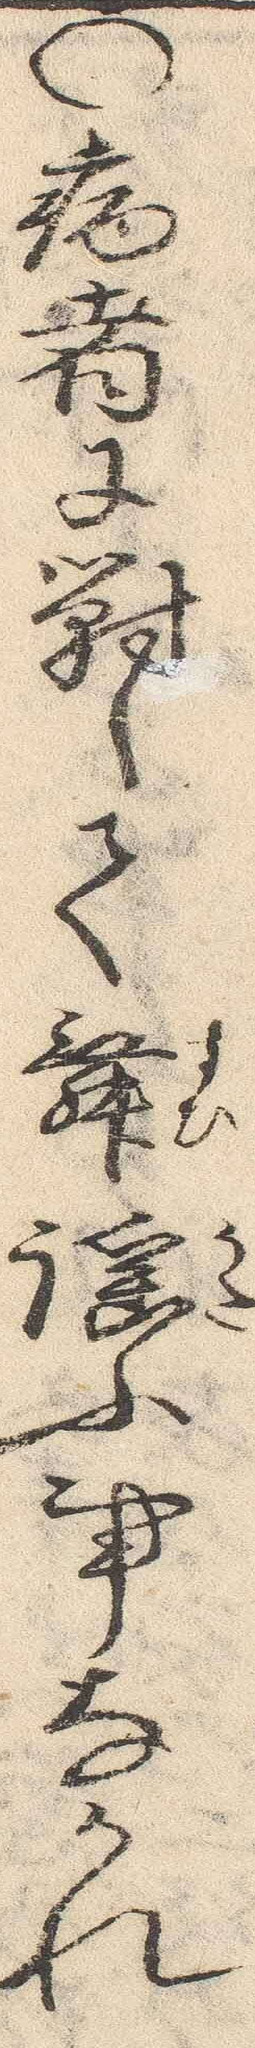○病者に対して舞謡ふ事なかれ
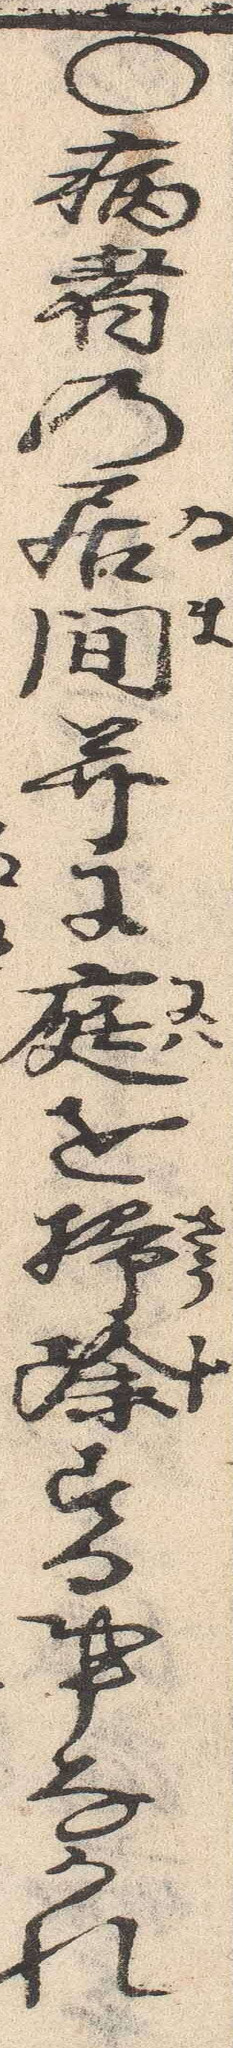○病者の居間并に庭を掃除する事なかれ
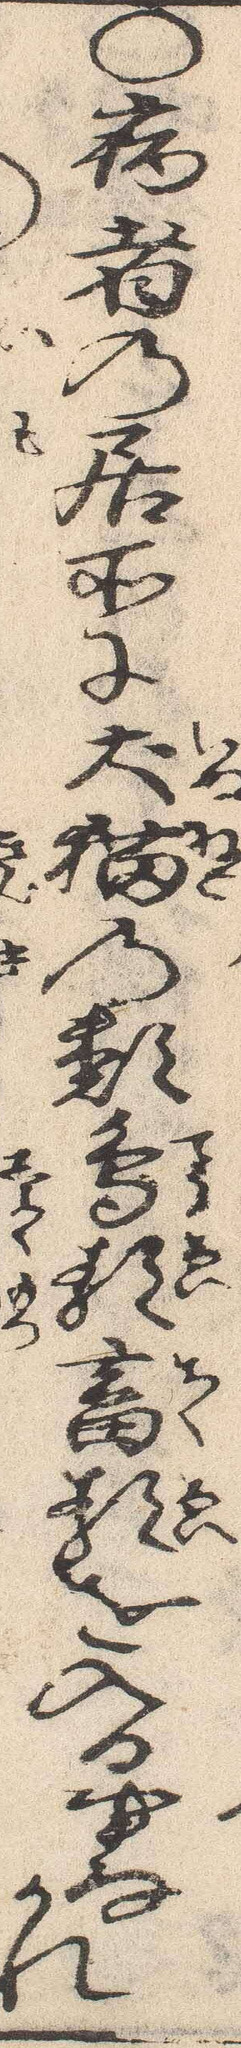○病者の居所に犬猫の類鳥類畜類を入る事なかれ
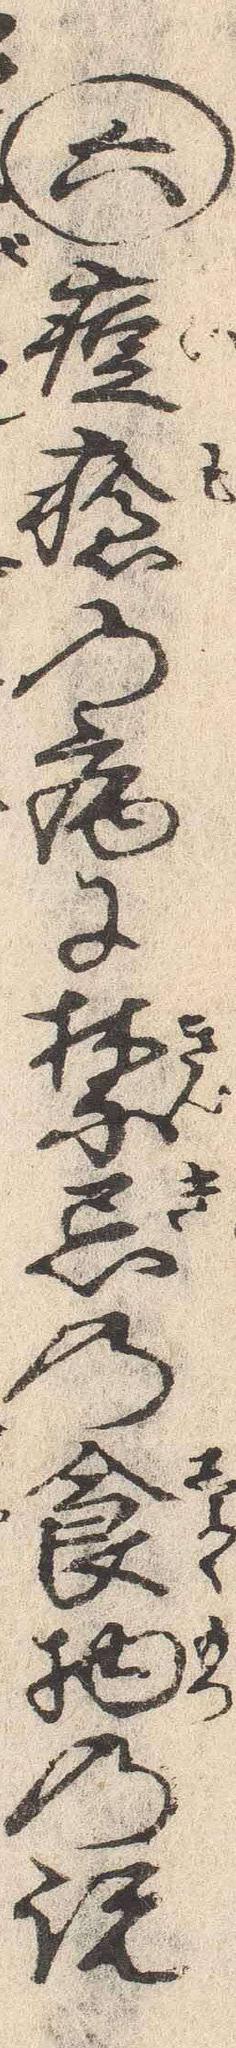㊅痘瘡の病に禁忌の食物の説
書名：小児必用養育草
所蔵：東京学芸大学附属図書館 国文学研究資料館
